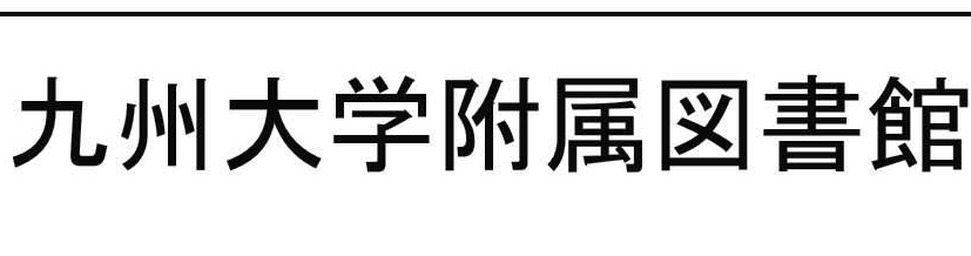九州大学附属図書館
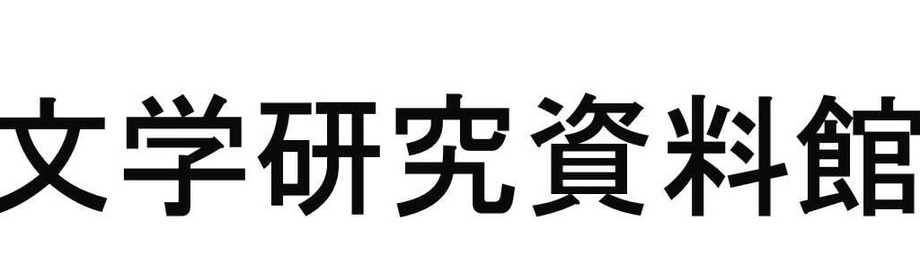国文学研究資料館
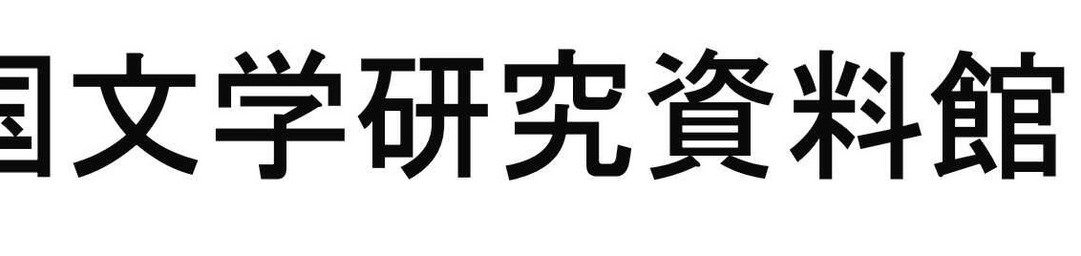国文学研究資料館
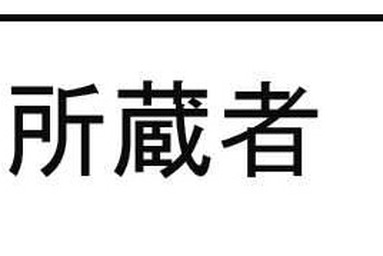所蔵者
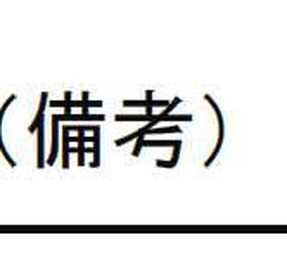(備考)

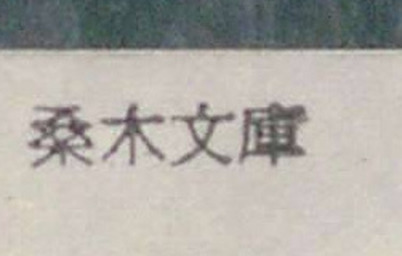桑木文庫

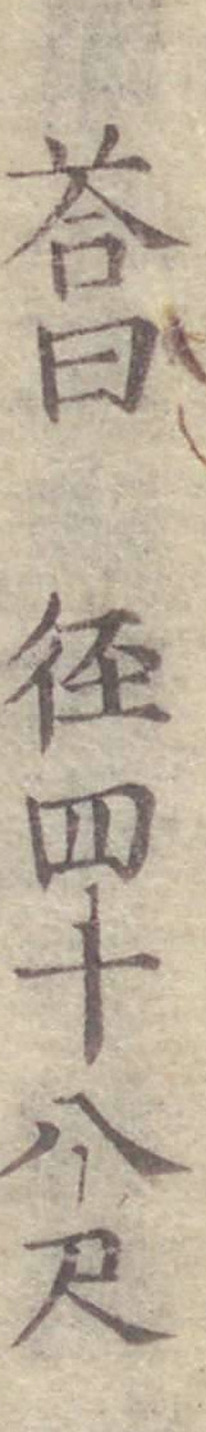答曰徑四十八尺

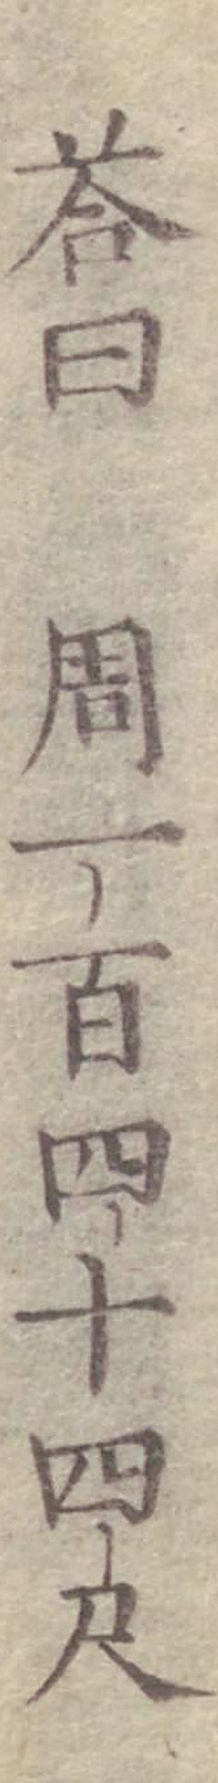答曰周一百四十四尺
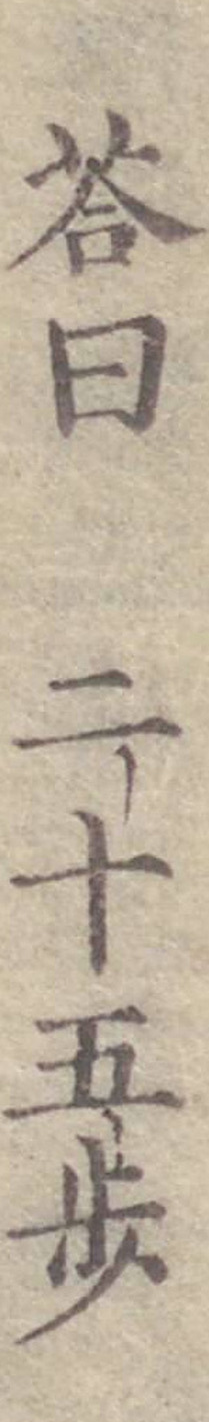答曰二十五步
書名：新編直指算法統宗 延寶三 桑木文庫/和書/297
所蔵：九州大学中央図書館 国文学研究資料館
